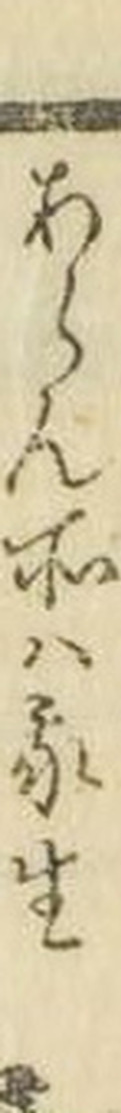あらん所は我生
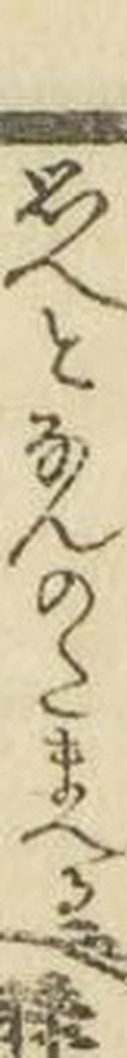思へとなんのたまへる
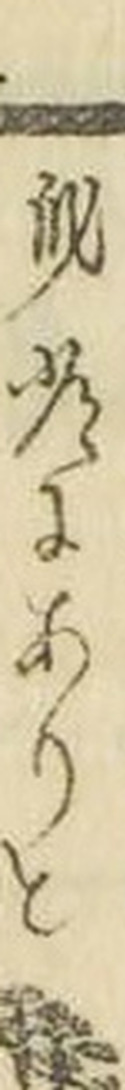身常にありと
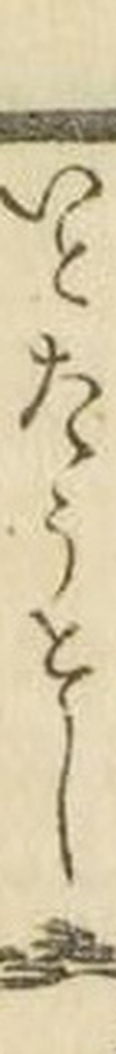いとたうとし

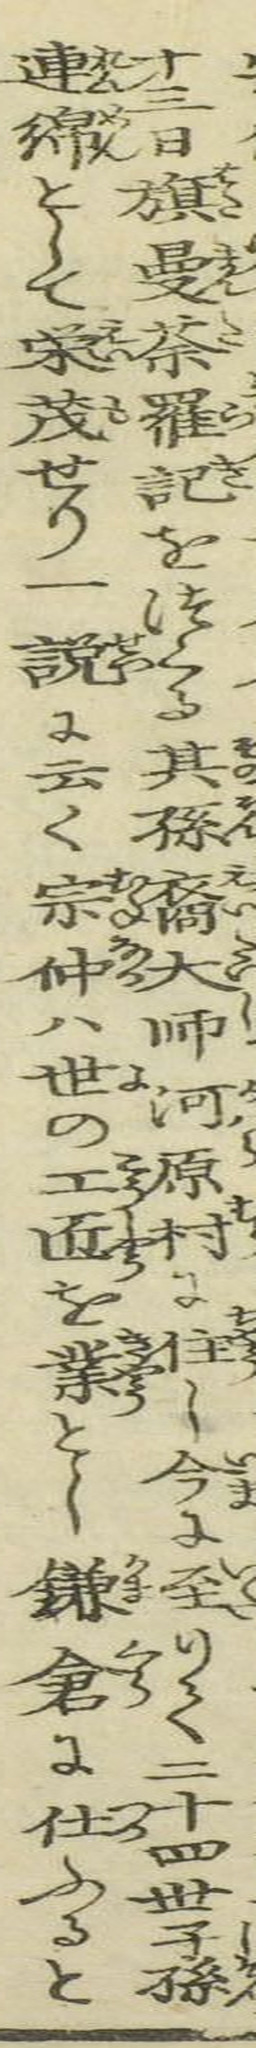連綿として栄茂せり一説に云く宗仲は世の工匠を業とし鎌倉に仕ふるとなり
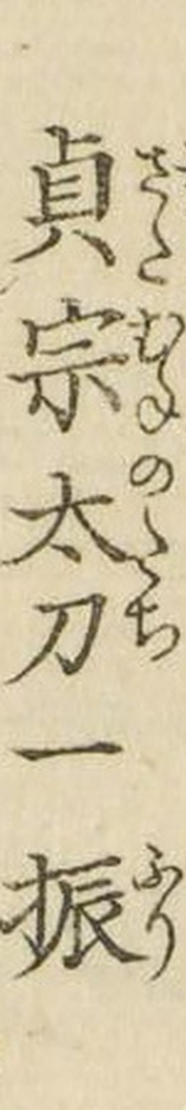貞宗太刀一振
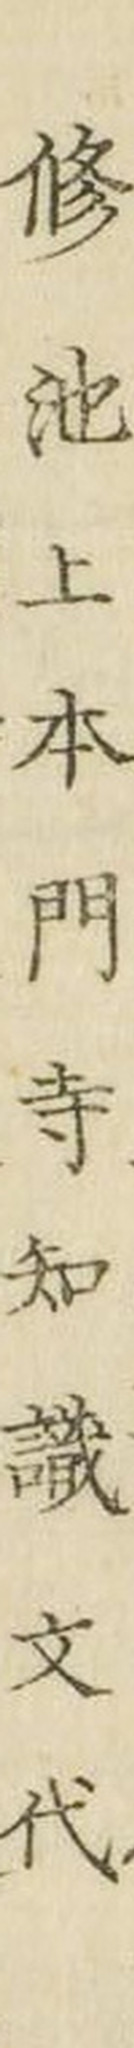修池上本門寺知識文代
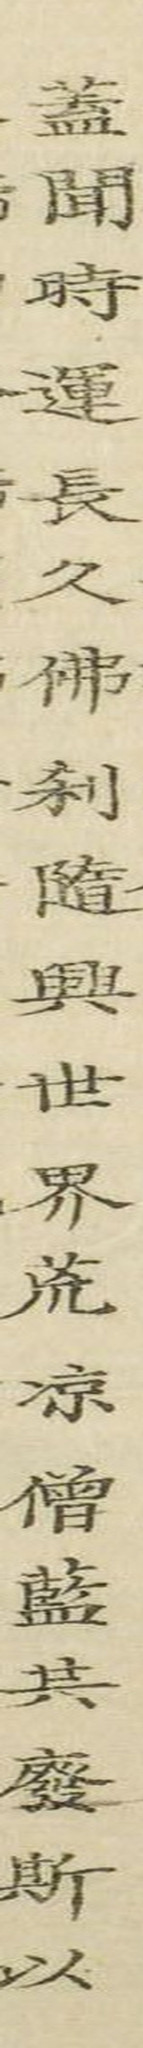蓋聞時運長久佛刹隨興世界荒凉僧藍共廢斯以
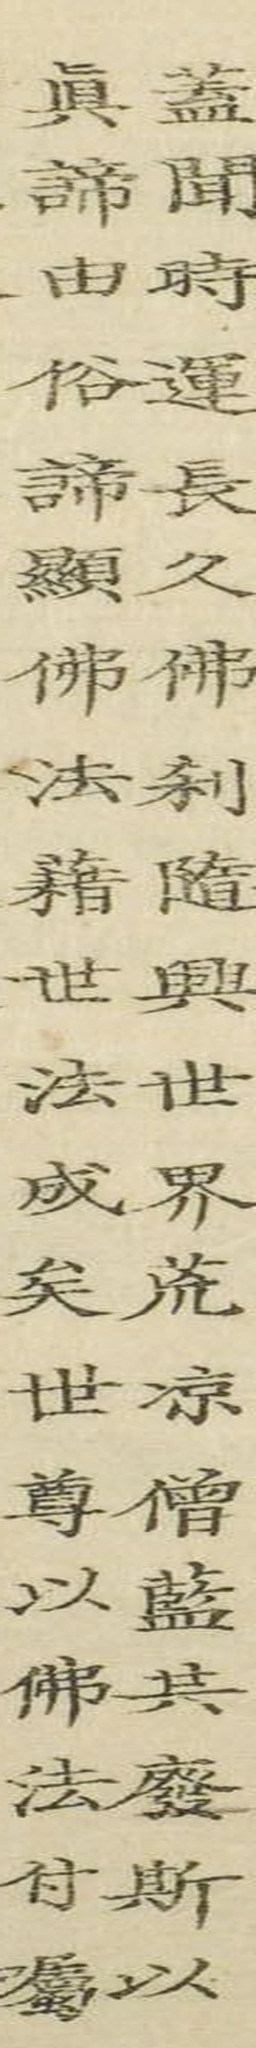眞諦由俗諦顯佛法藉世法成矣世尊以佛法付囑
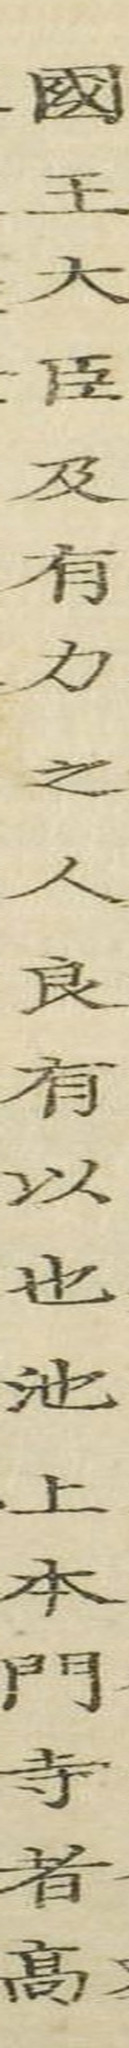國王大臣及有力之人良有以也池上本門寺者髙
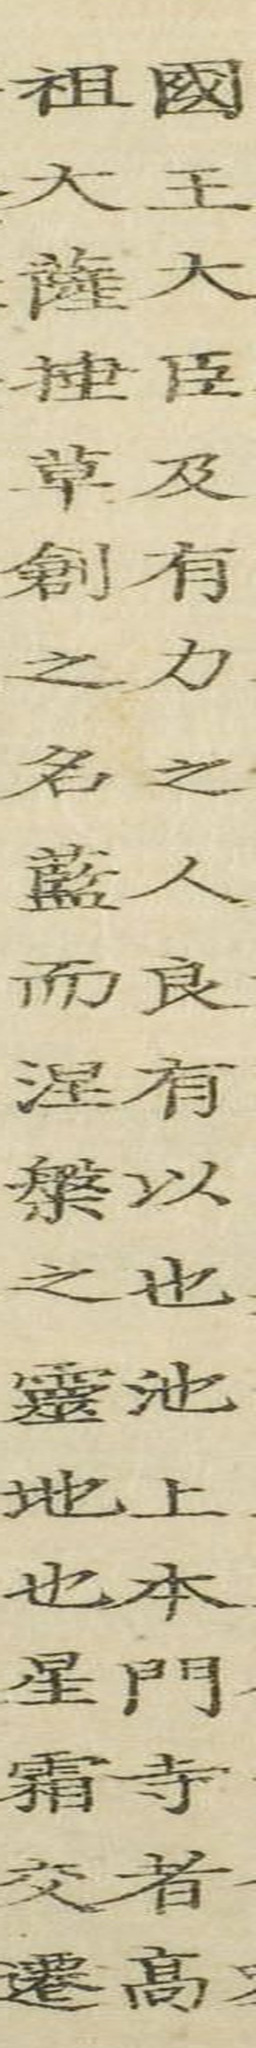租大薩捶草創之名藍而涅槃之靈地也星霜交遷
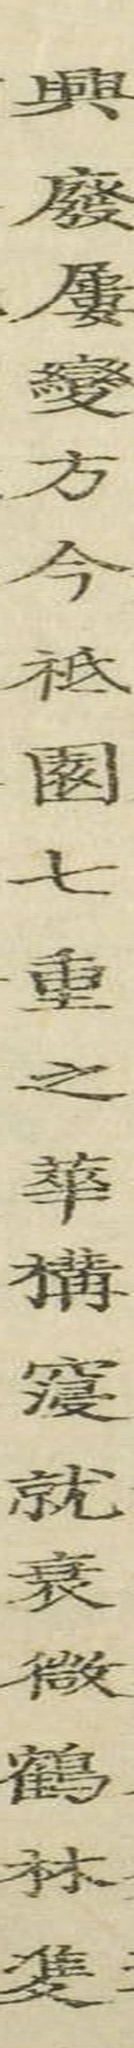興廢廔變方今祇園七重之華構䆮就衰微鶴林㕠
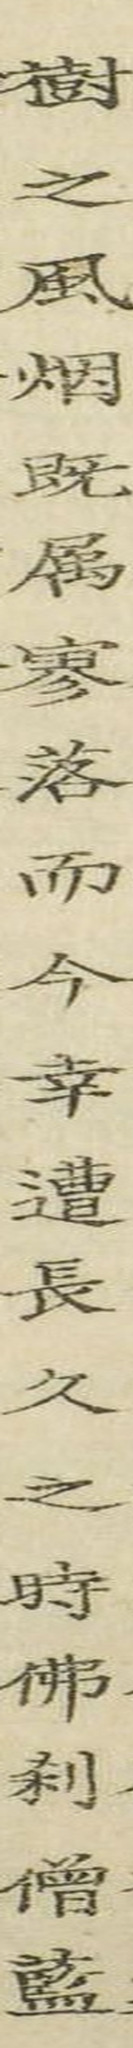樹之風烟既属寥落而今幸遭長久之時佛刹僧藍
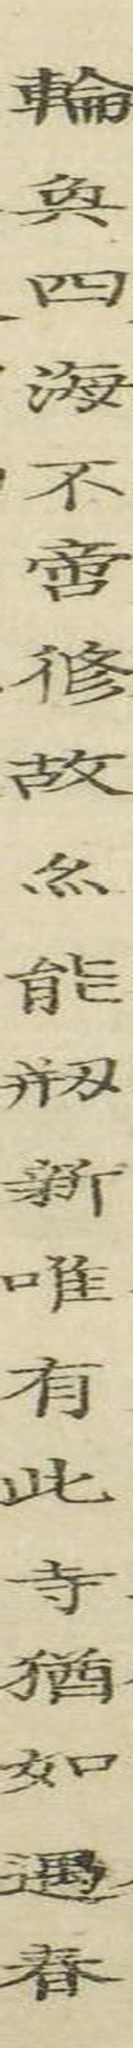輪𩵋四海不啻修故𬉹能剏新唯有此寺猶如遇春
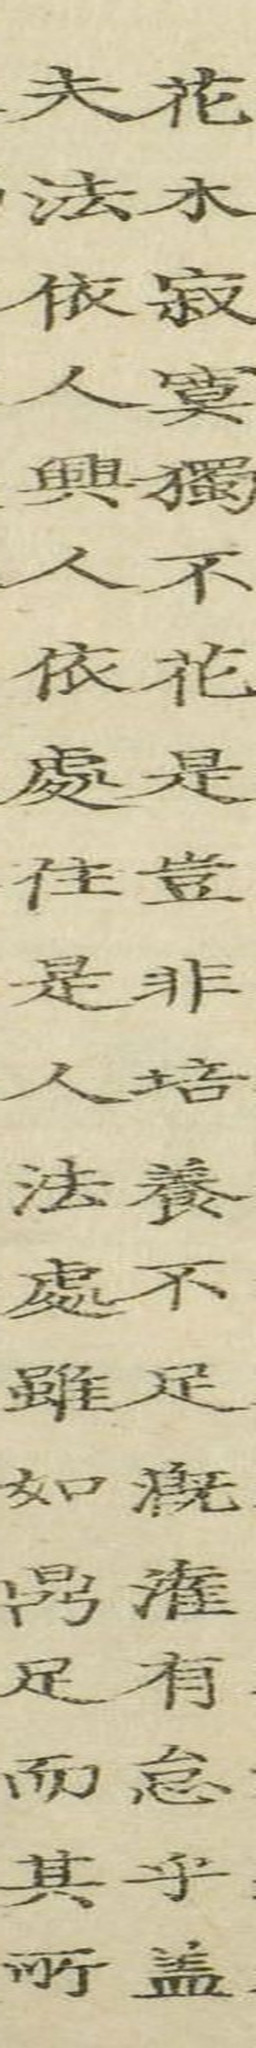夫法依人興人依處住是人法處雖如𣇓足而其所
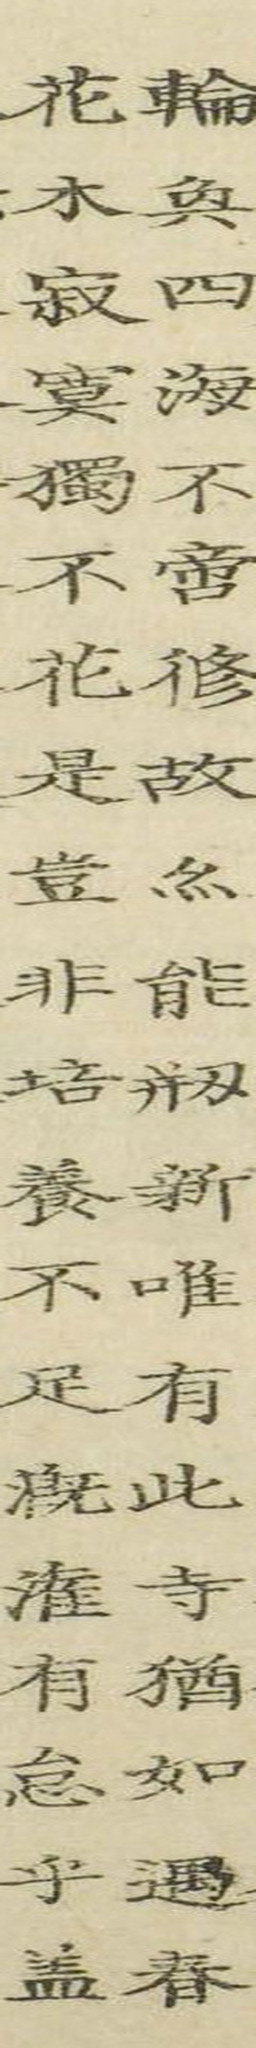花木寂寞獨不花是豈非培養不足漑灌有怠乎盖
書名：江戸名所図会 20巻 巻之4
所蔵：東京学芸大学教育コンテンツアーカイブ
